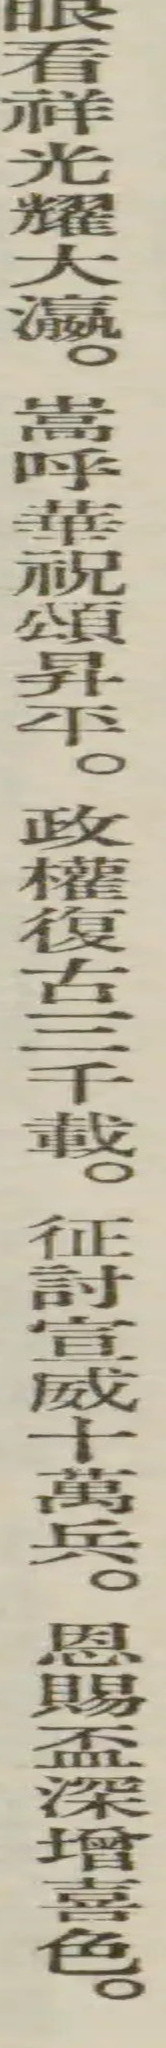眼看祥光耀大瀛。嵩呼華祝頌昇平。政權復古三千載。征討宣威十萬兵。恩賜盃深増喜色。
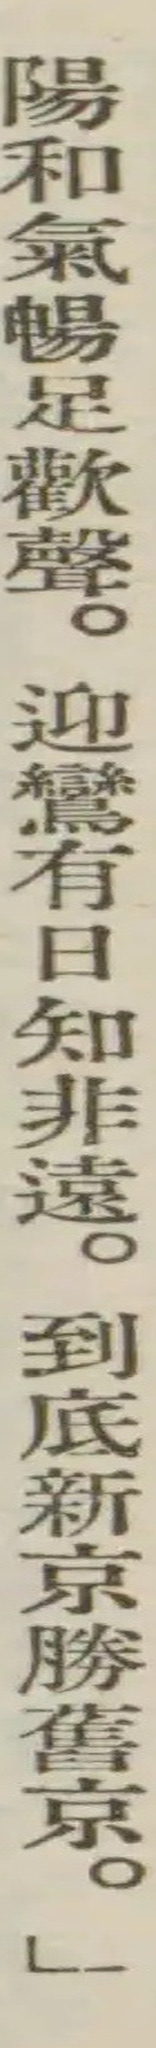陽和氣暢足歡聲。迎鸞有日知非遠。到底新京勝旧京。」
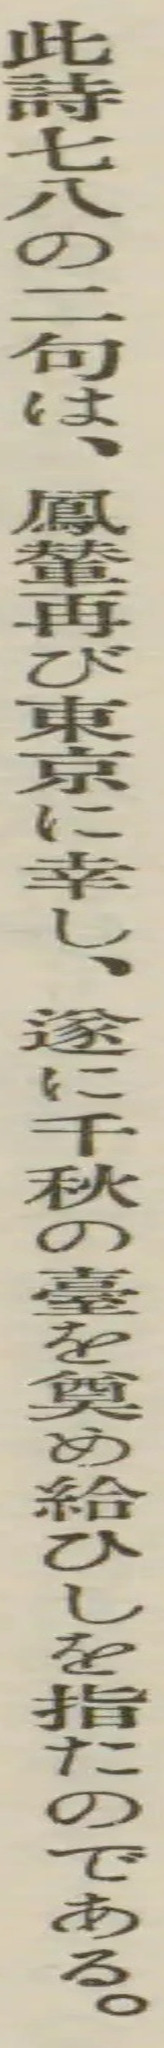此詩七八の二句は、鳳輦再び東京に幸し、遂に千秋の台を奠め給ひしを指たのである。
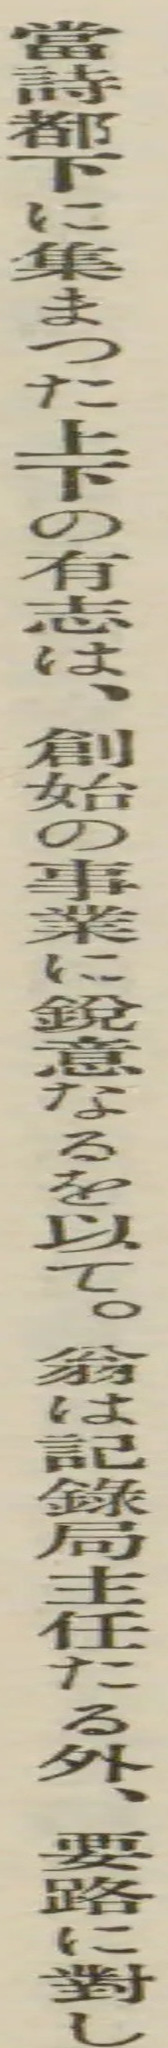当詩都下に集まつた上下の有志は、創始の事業に鋭意なるを以て。翁は記録局主任たる外、要路に対し

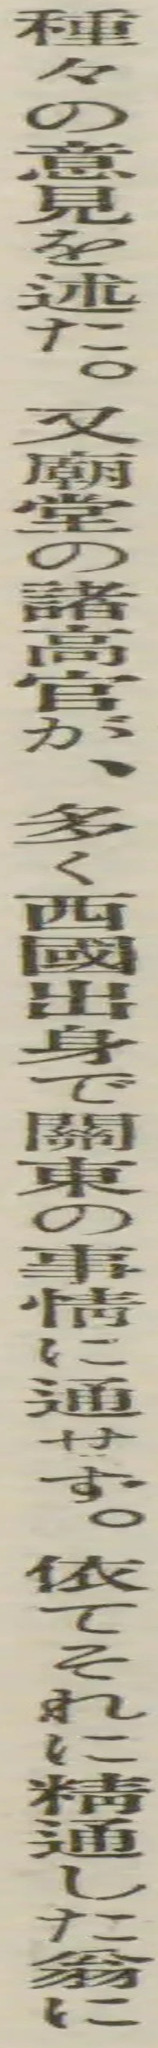種々の意見を述た。又廟堂の諸高官が、多く西国出身で関東の事情に通せず。依てそれに精通した翁に
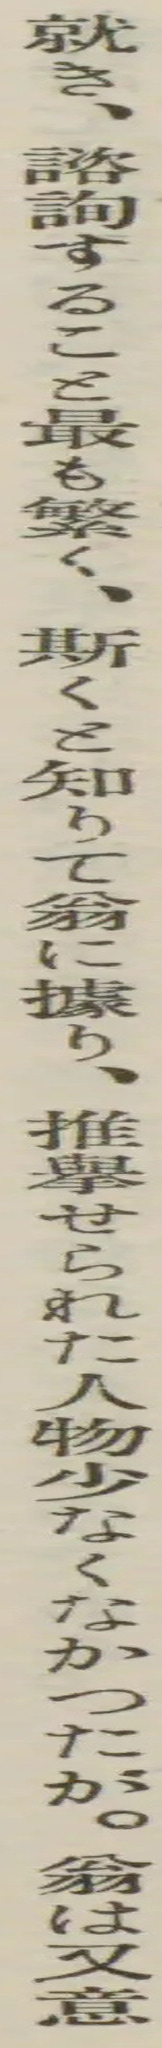就き、諮詢すること最も繁く、斯くと知りて翁に拠り、推挙せられた人物少なくなかつたが。翁は又意
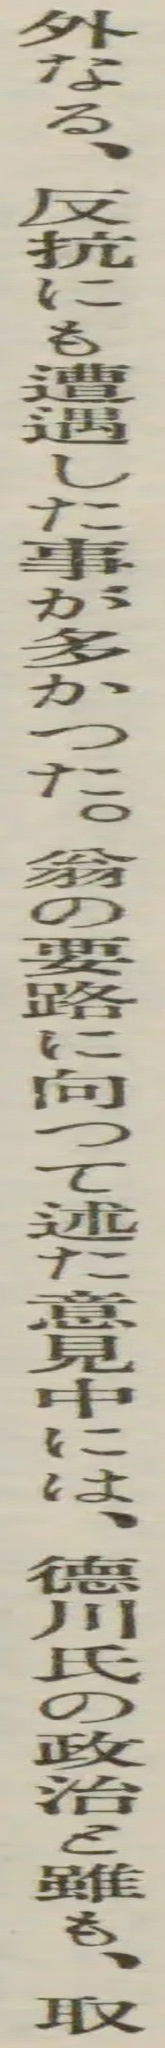外なる、反抗にも遭遇した事が多かつた。翁の要路に向つて述た意見中には、徳川氏の政治と雖も、取
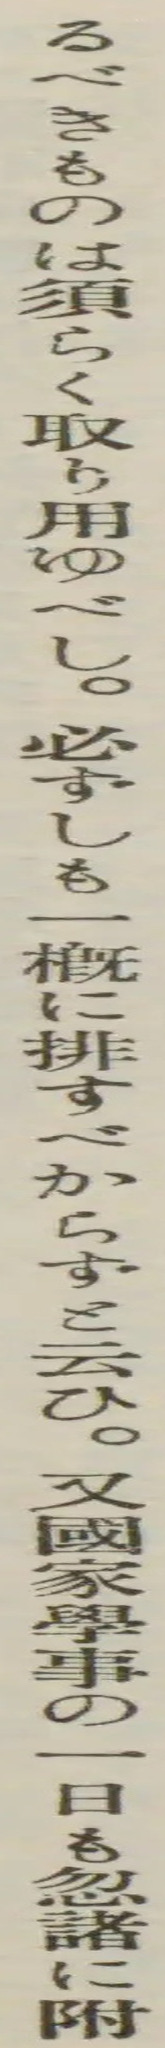るべきものは須らく取り用ゆべし。必ずしも一概に排すべからずと云ひ。又国家学事の一日も忽諸に附
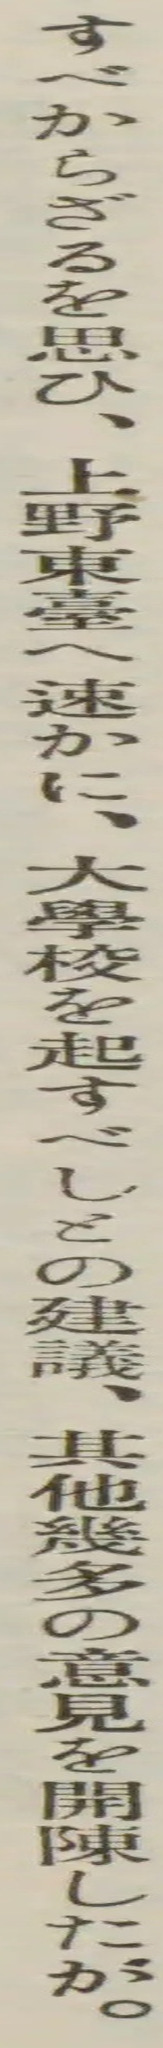すべからざるを思ひ、上野東台へ速かに、大学校を起すべしとの建議、其他幾多の意見を開陳したが。
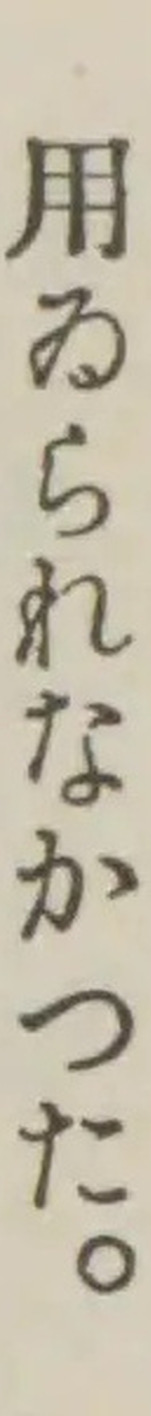用ゐられなかつた。
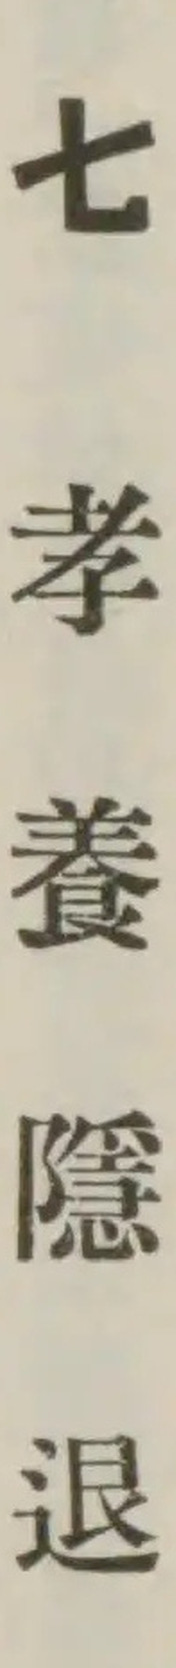七孝養隠退
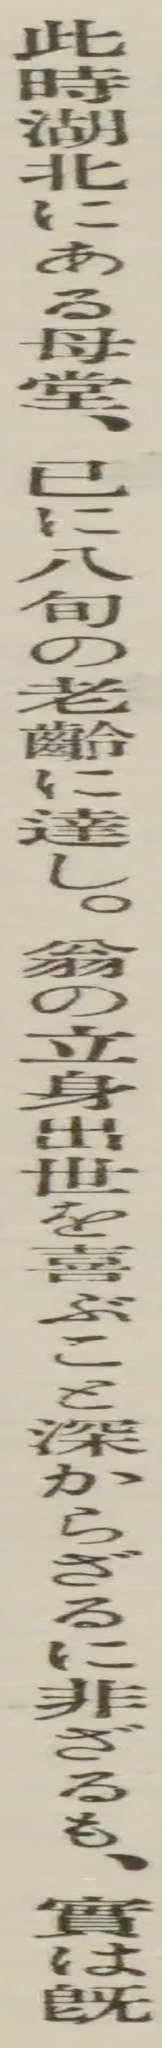此時湖北にある母堂、已に八旬の老齢に達し。翁の立身出世を喜ぶこと深からざるに非ざるも、実は既
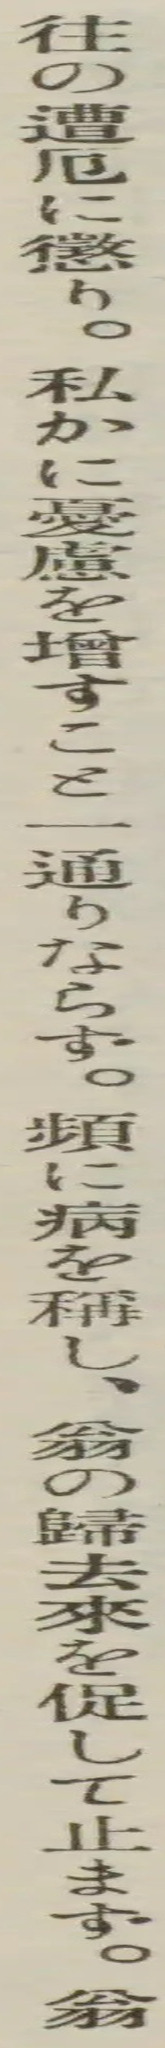往の遭厄に懲り。私かに憂慮を増すこと一通りならず。頻に病を称し、翁の帰去来を促して止まず。翁
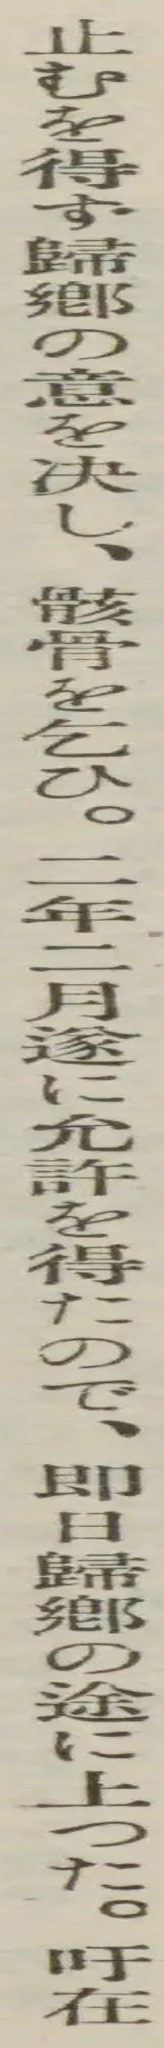止むを得ず帰郷の意を決し、骸骨を乞ひ。二年二月遂に允許を得たので、即日帰郷の途に上つた。吁在
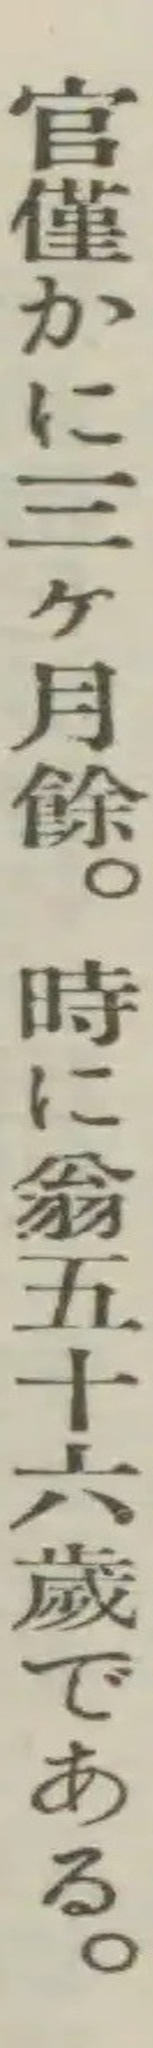官僅かに三ヶ月余。時に翁五十六歳である。
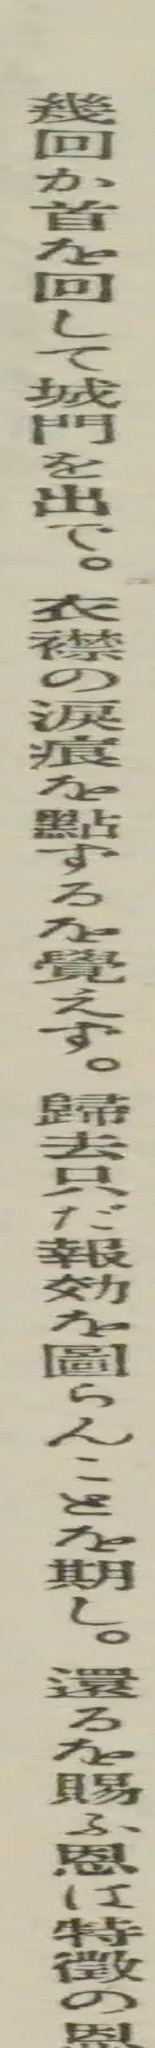幾回か首を回して城門を出で。衣襟の涙痕を点ずるを覚ず。帰去只だ報効を図らんことを期し。還るを賜ふ恩は特徴の恩にまさる。
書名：小野湖山翁小伝
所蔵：国立国会図書館 National Diet Library, JAPAN
